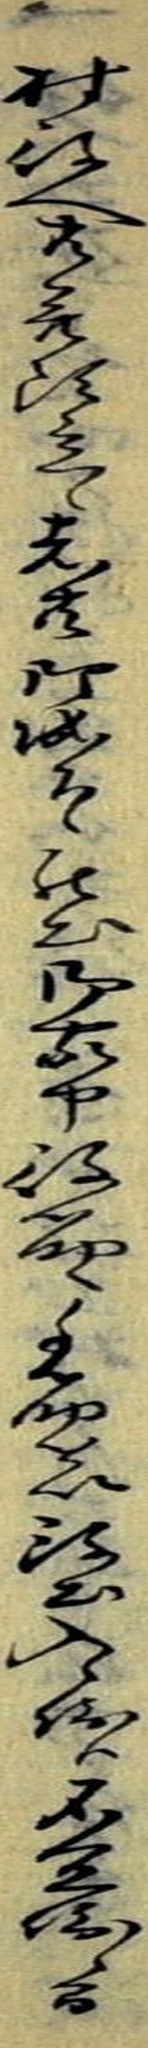村役人共并頭立候者共御城下へ罷出御家中役筋へ手筋を以致出入候儀ハ不宜儀候間
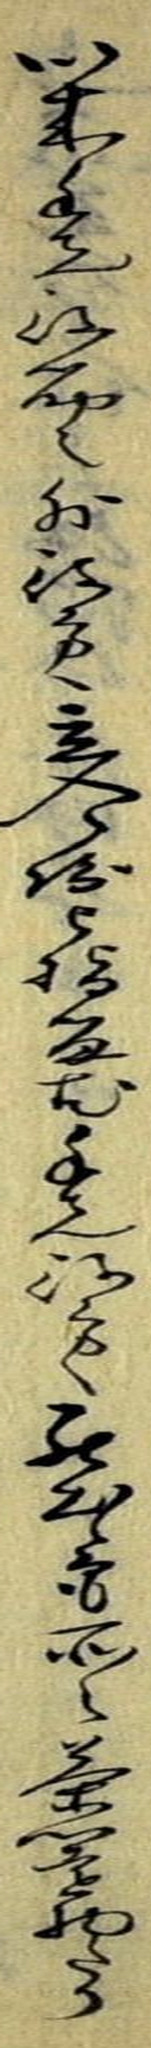以来手元役筋之外役方へ立入候儀被指留尤手元役方へ罷出候而も所之茶薗物たり
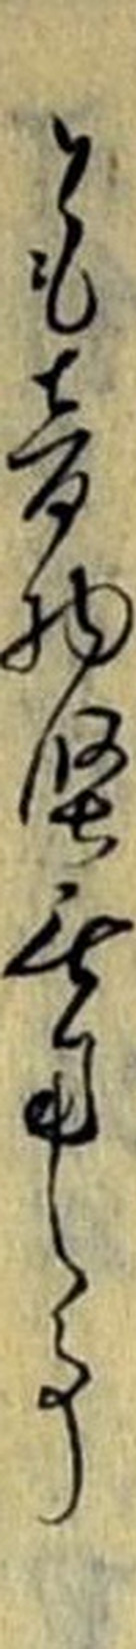とも音物堅無用之事
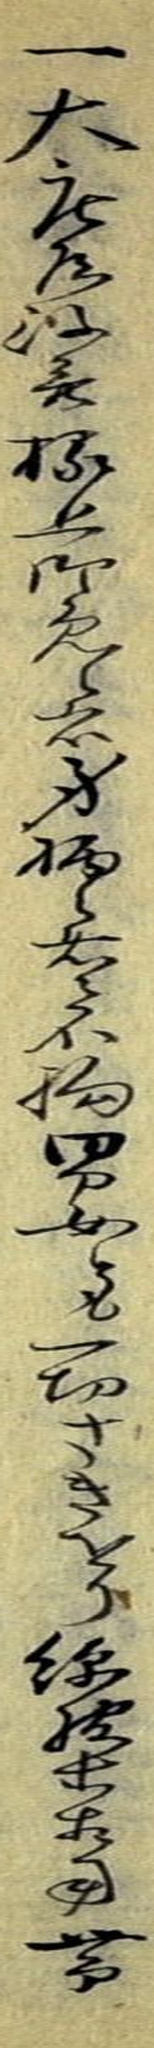一大庄屋役并椽上御免候者身柄之者ニ不拘男女とも一切さきをり綿服等相用帯
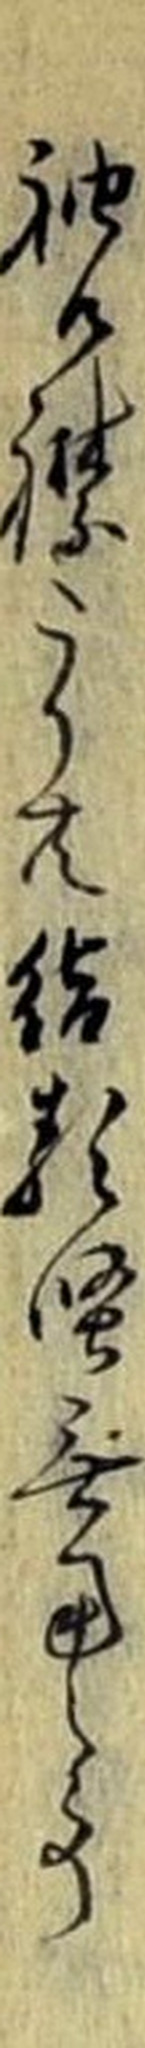袖口襟たり共絹類堅無用之事
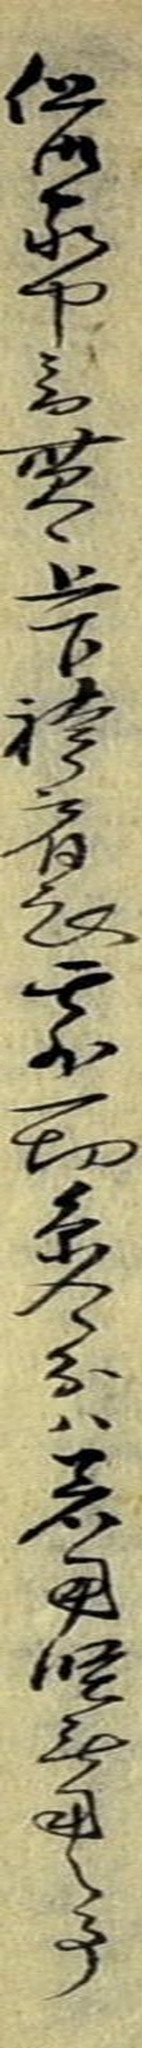但御家中ニ而貰候上下袴着衣其外一切糸入候分ハ着用堅無用之事
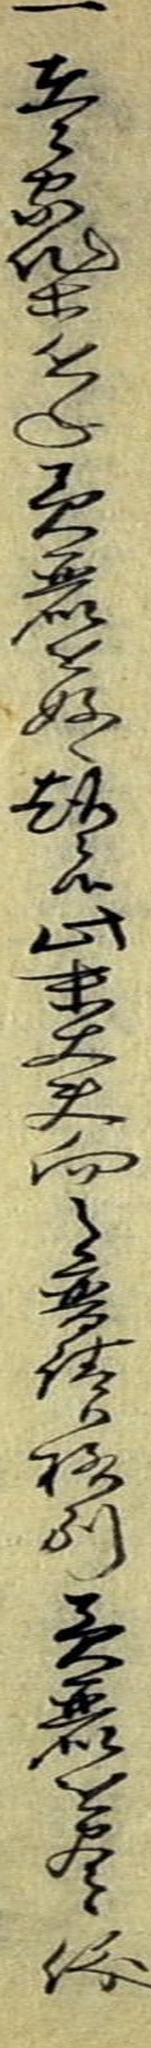一在々家作等近年美麗を好候趣ニ候此末丈夫向之普請ハ格別美麗を尽候儀
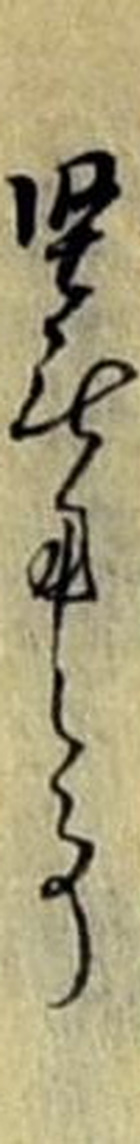堅無用之事
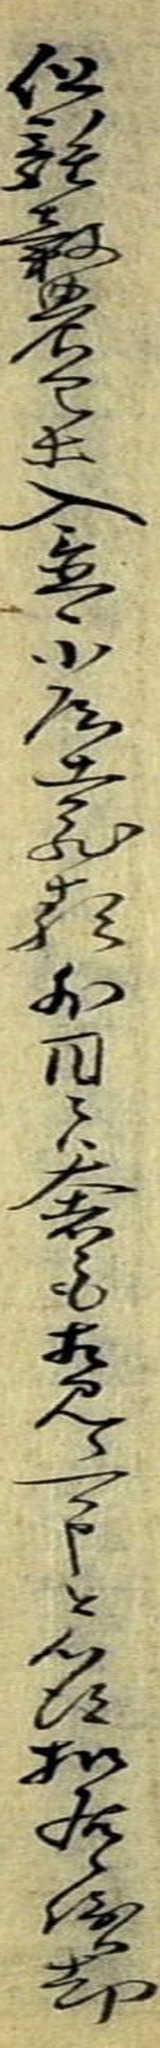但雑穀農具等入置候小屋土蔵類外目ニハ奢ニも相見候可申と心得扣居候儀ハ却
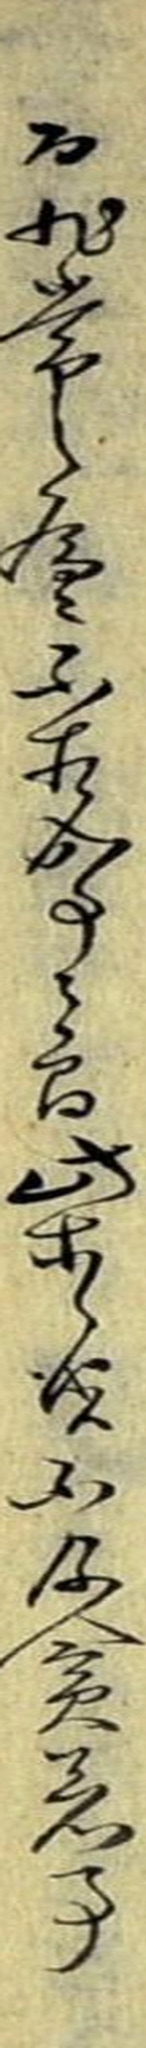而非常之為ニ不相成事ニ候間此等之儀ハ不及貪着事
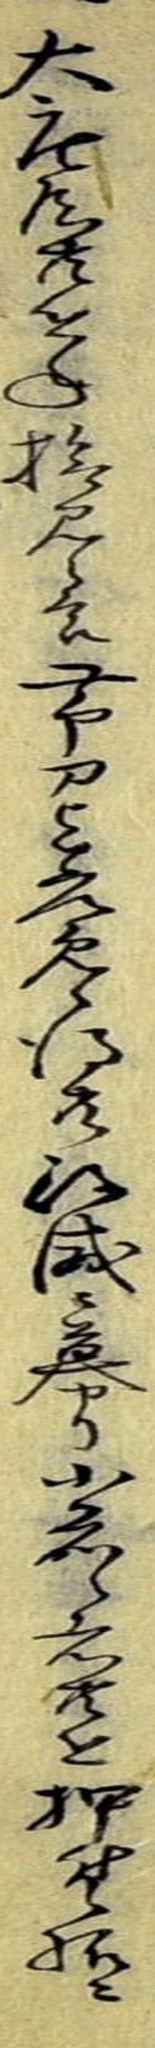一大庄屋共近年検見之節帯刀被差免候得共役威ニ幕り小前之者共を押付候様ニ
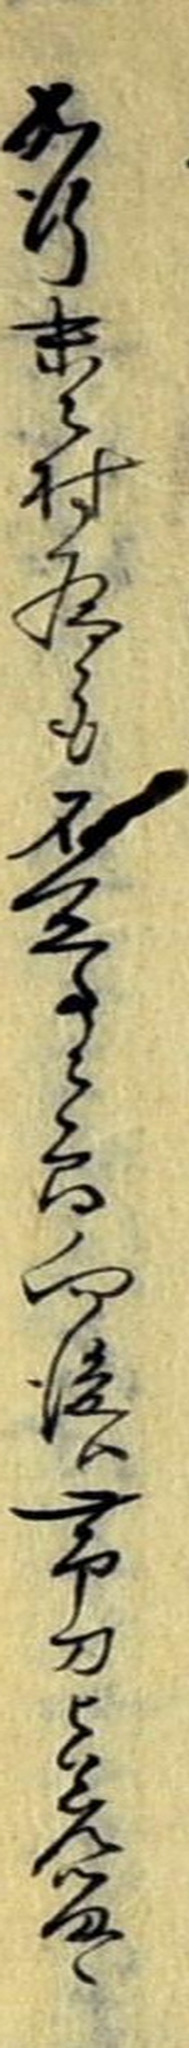成行末々村為ニも不宜事ニ候間向後帯刀被差留候

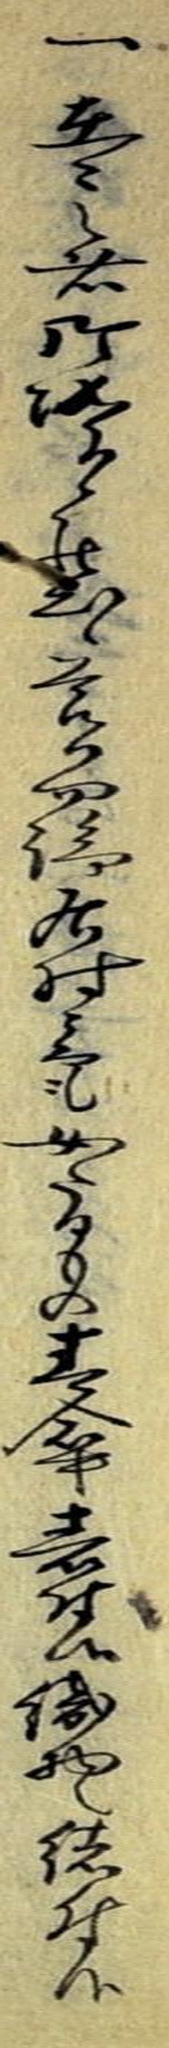一在々之者御城下へ罷出候節ハ勿論居村ニ而も女たるもの青傘表付候織物之結付候
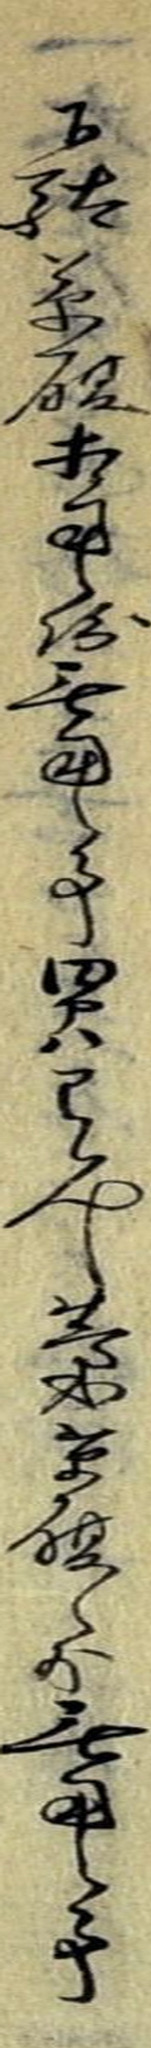下駄草履相用之儀無用之事男わらし藁草履之外無用之事
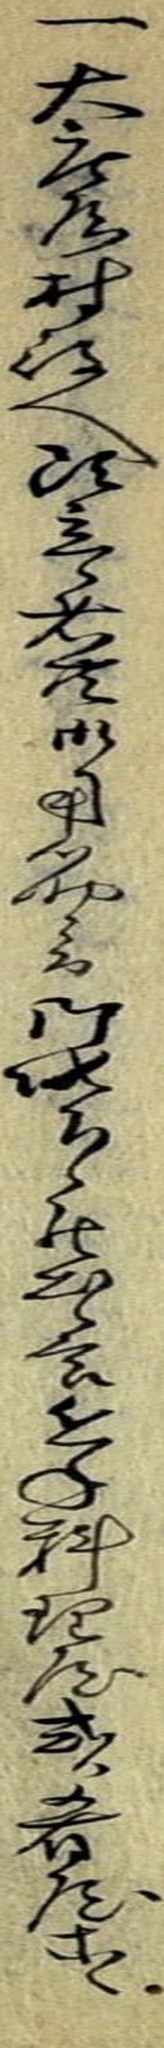一大庄屋村役人頭立候者共御用筋ニ而御城下へ罷出候節近年料理屋或ハ肴屋等へ
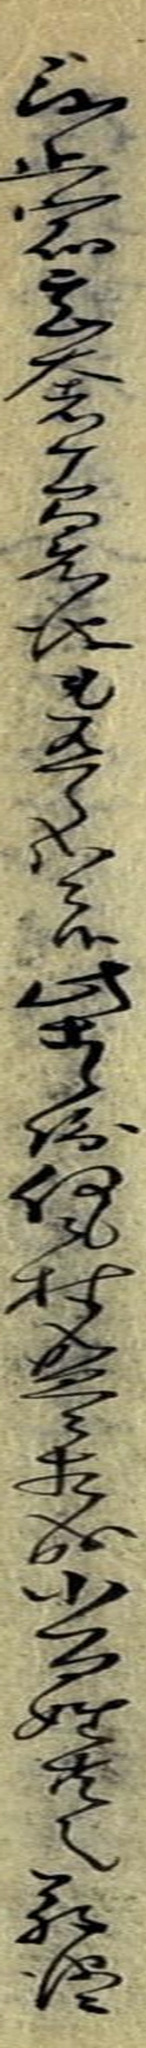致止宿甚奢ケ間敷儀も有之哉ニ候此等之儀何も村盛ニ相成小百姓共之難儀ニ
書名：命令之部 五
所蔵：福井県文書館 Fukui Prefectural Archives
